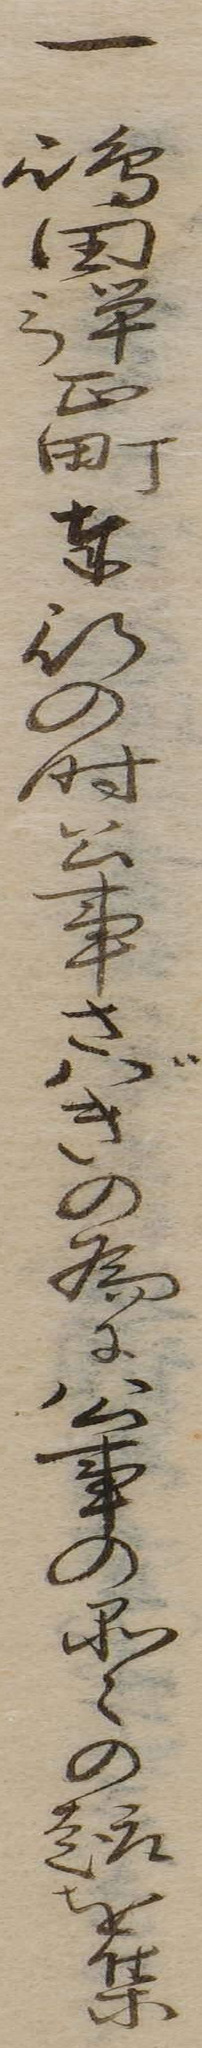一嶋田弾正町奉行の時公事さばきの為に公事の品々の趣を集

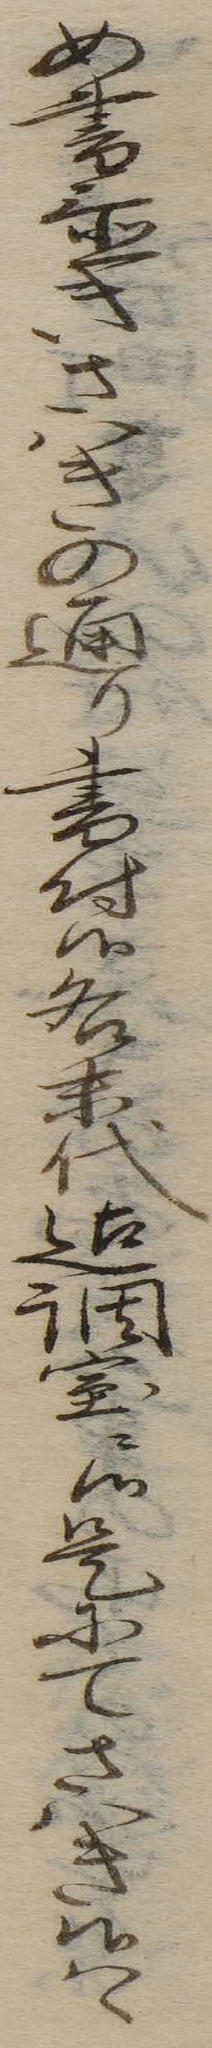め書置きさはきの通り書付候各末代迄調宝ニ候是にてさはき候はゝ
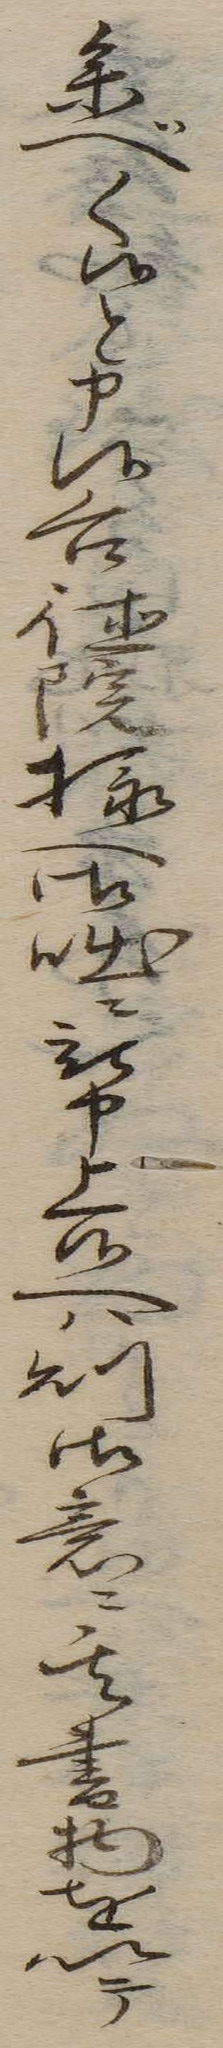参べく候と申候台徳院様へ御咄ニ被申上候へは則御意ニ其書物を以テ
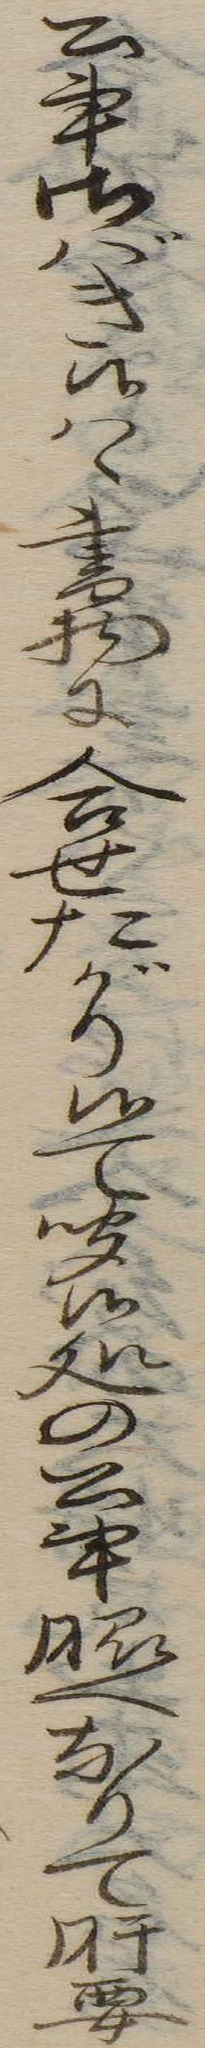公事さばき候はゝ書物に合せたがり候て聞候処の公事脇へなりて肝要
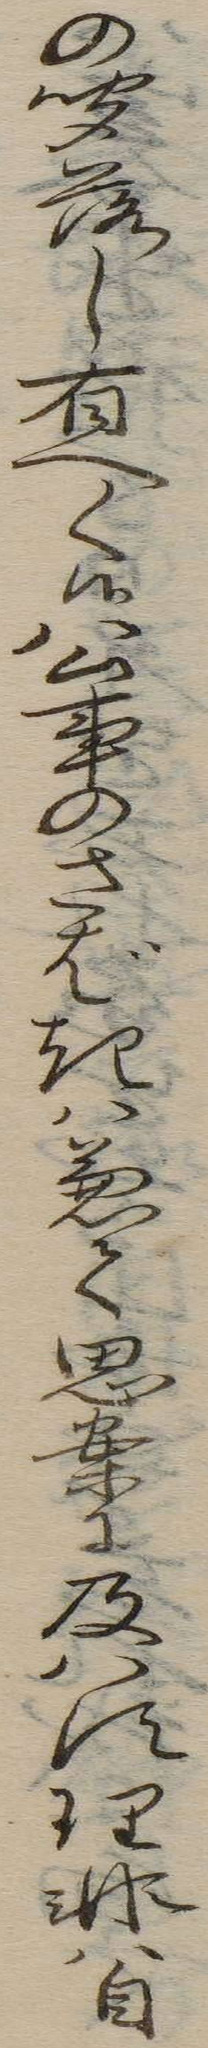の聞落し有へく候公事のさばきは兼て思案に及はす理非は自
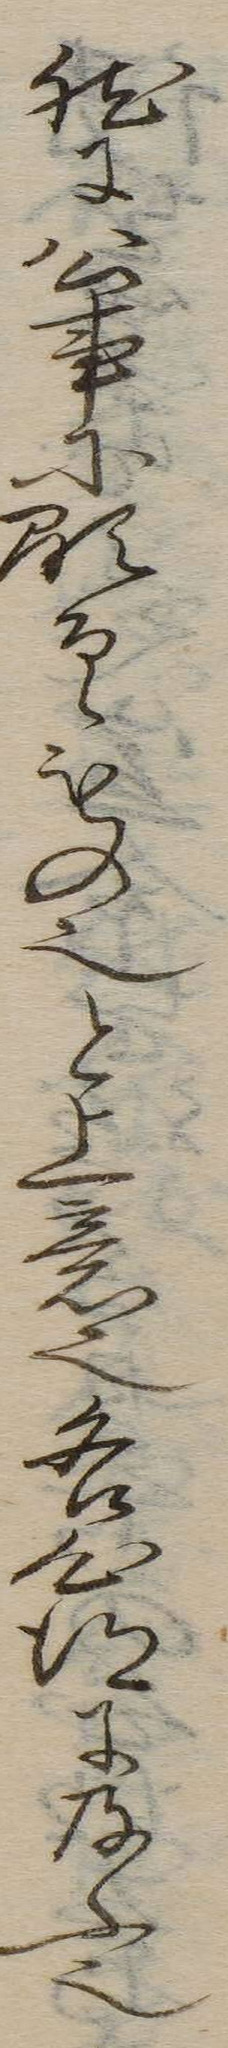然に公事に顕るゝもの也と上意也各心得に及ふ也
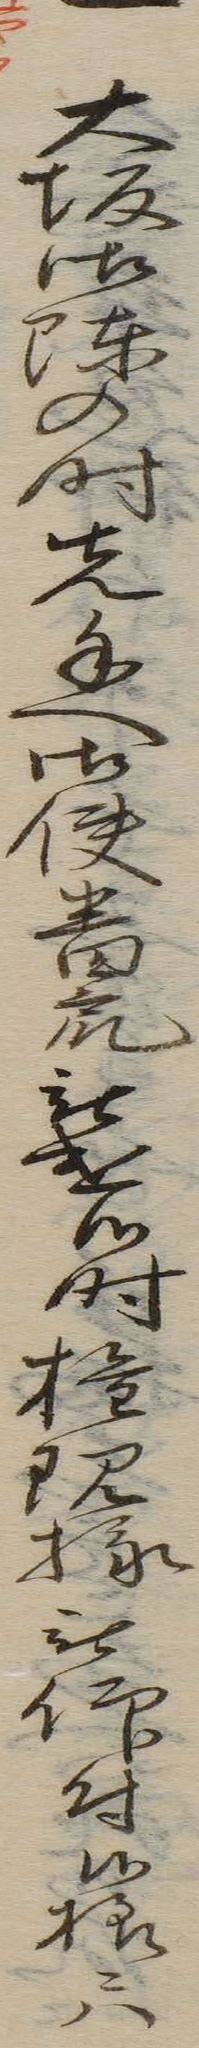一大坂御陣の時先手へ御使番衆被遣候時権現様被仰付候様ニは
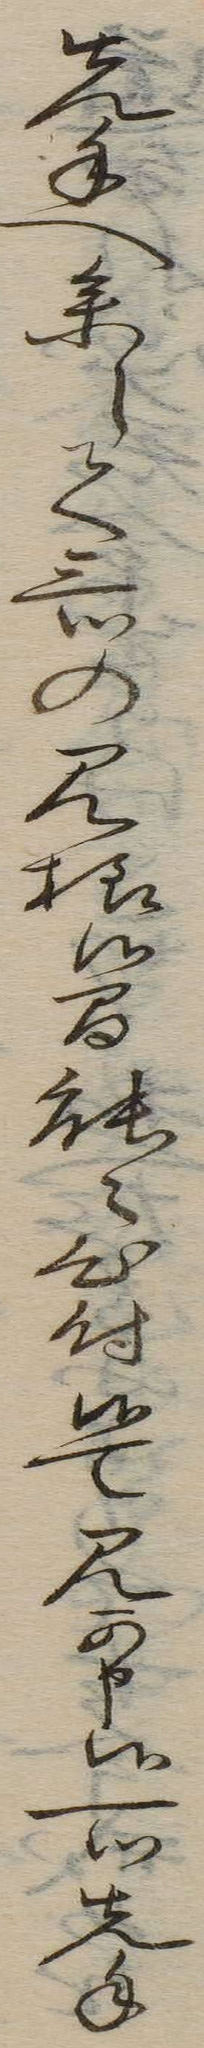先手へ参して三ツの見様候間能々心付候て見可申候一ツ先手
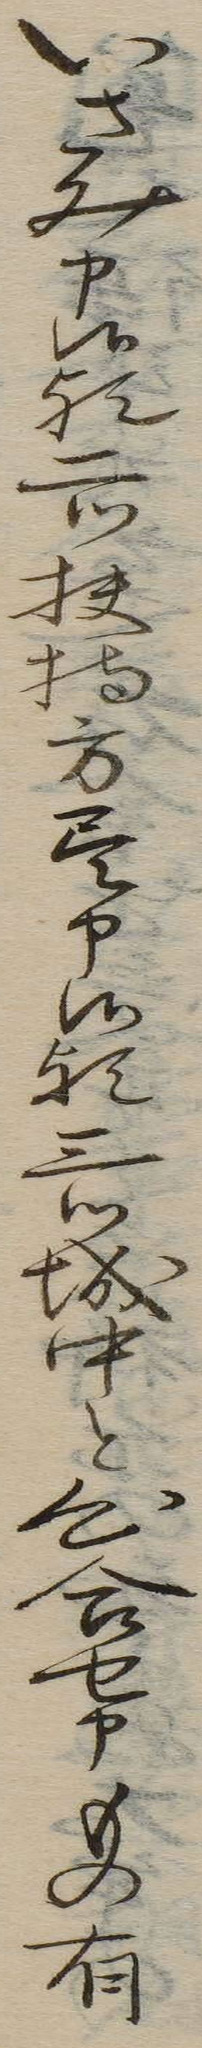いさみ申候歟二ツ扶持方尽申候歟三ツ城中と心合せ申もの有
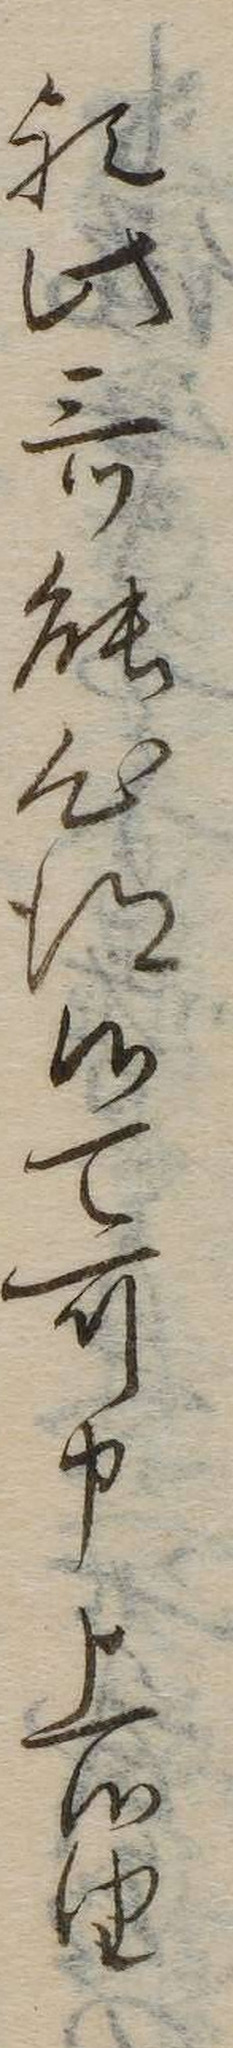歟此三ツ能心得候て可申上候由
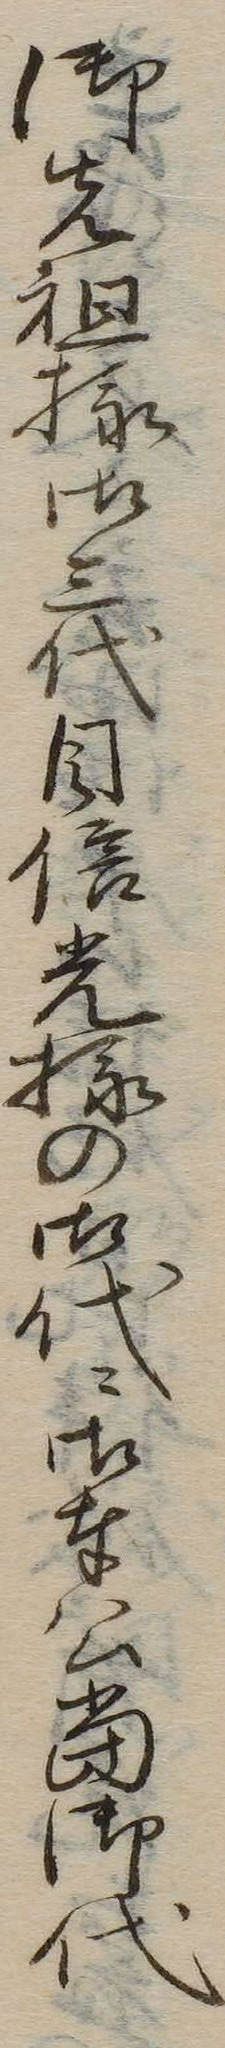御先祖様御三代目信光様の御代ニ御奉公当御代
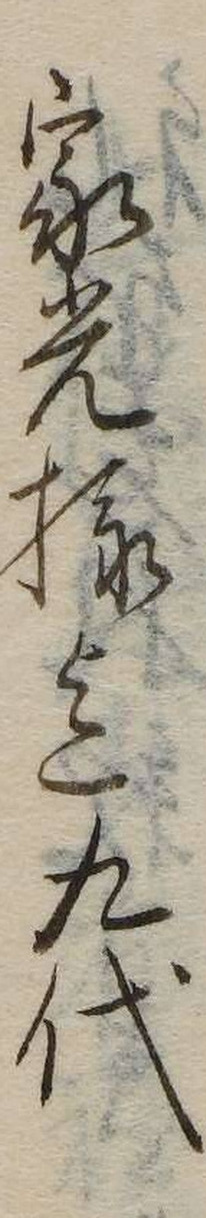家光様迄九代
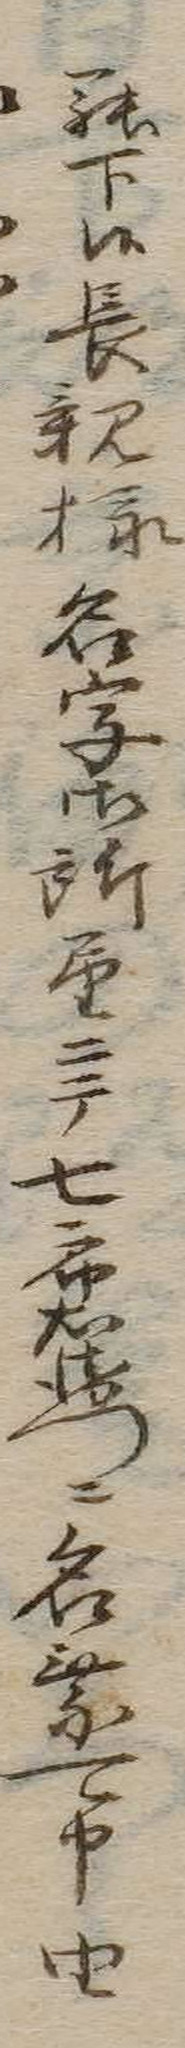罷下候長親様名字御所望ニテ七郎右衛門ニ名乗可申由
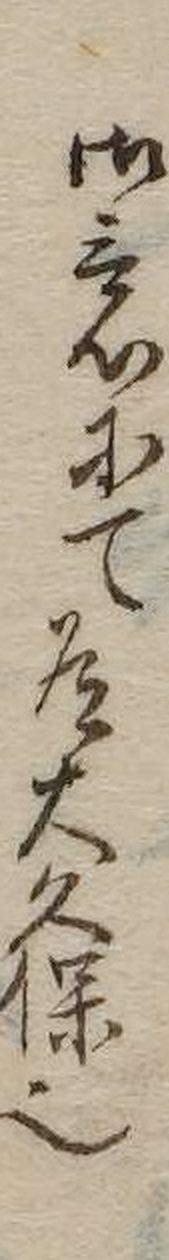御意にて為大久保也
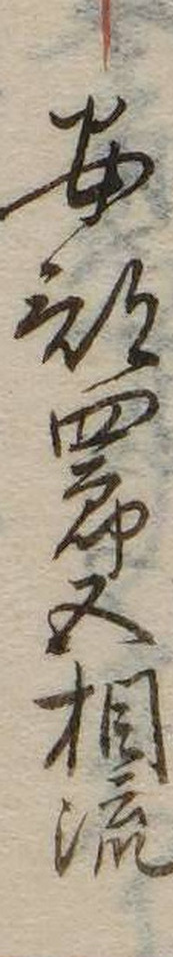―安部四郎五相流
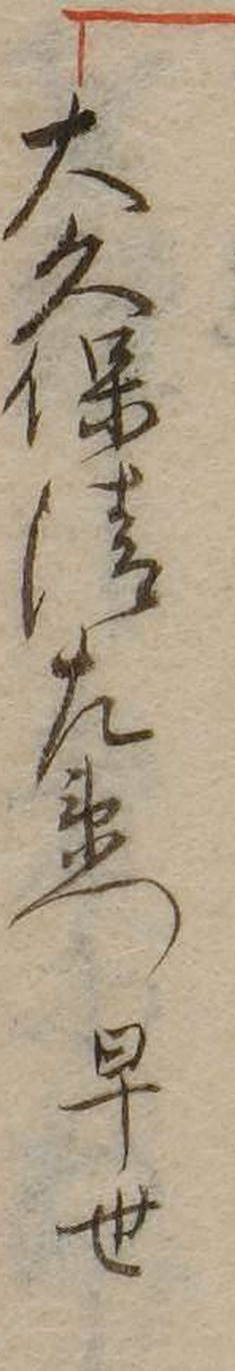―大久保清左衛門早世
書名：三河之物語
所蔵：国文学研究資料館
